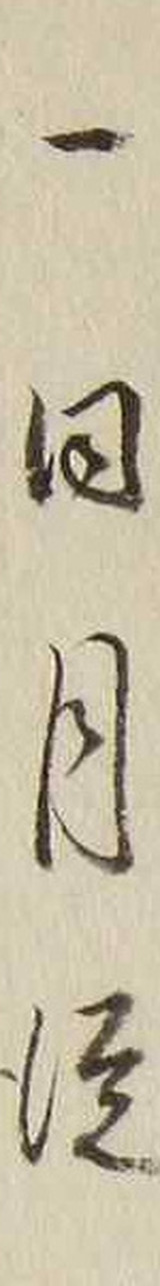一同月従

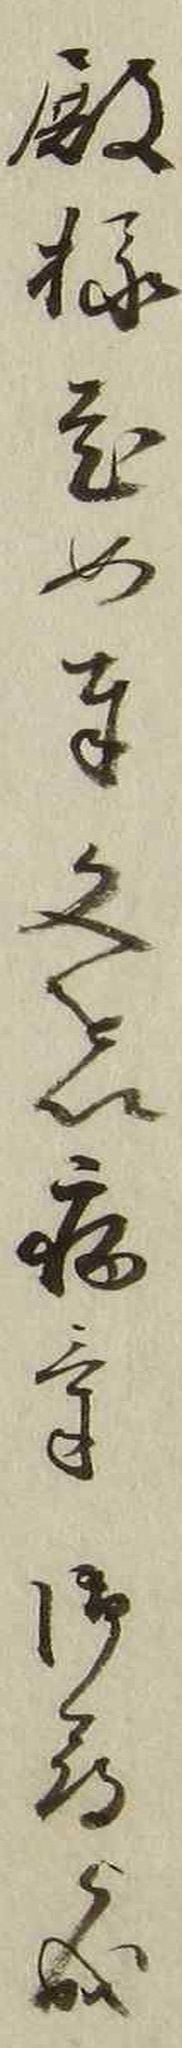殿様ひめ奉文を以病気御尋被成
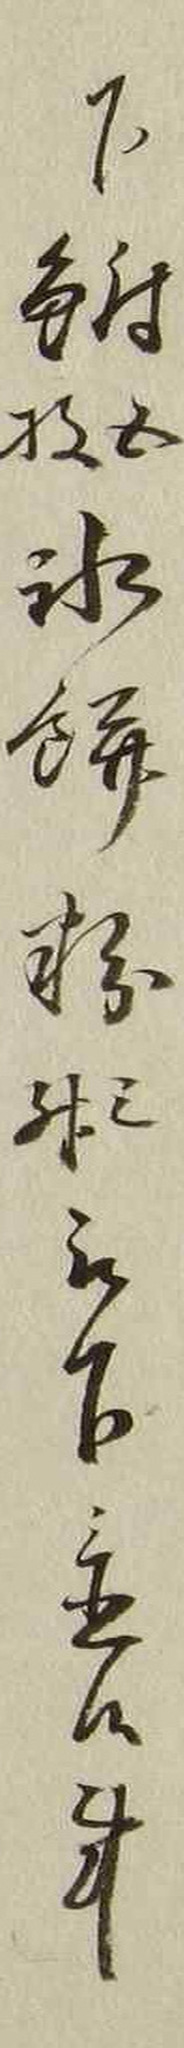下鮒五枚氷餅粉三升被下置候事
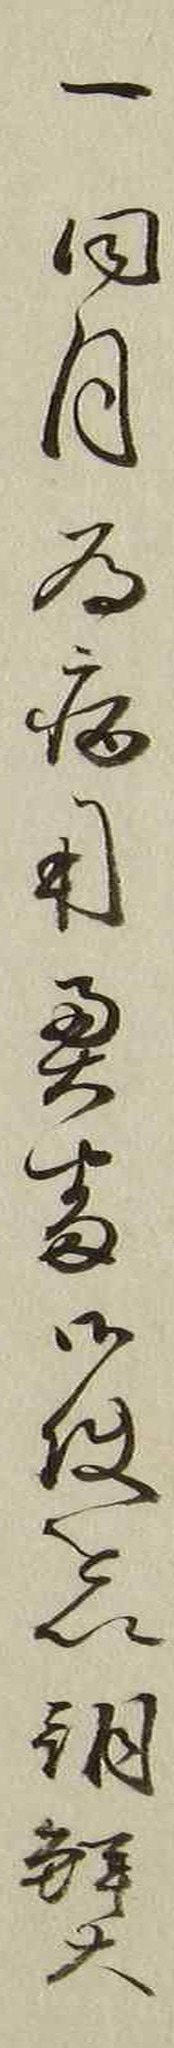一同月為病用奥番御使を以朝鮮大
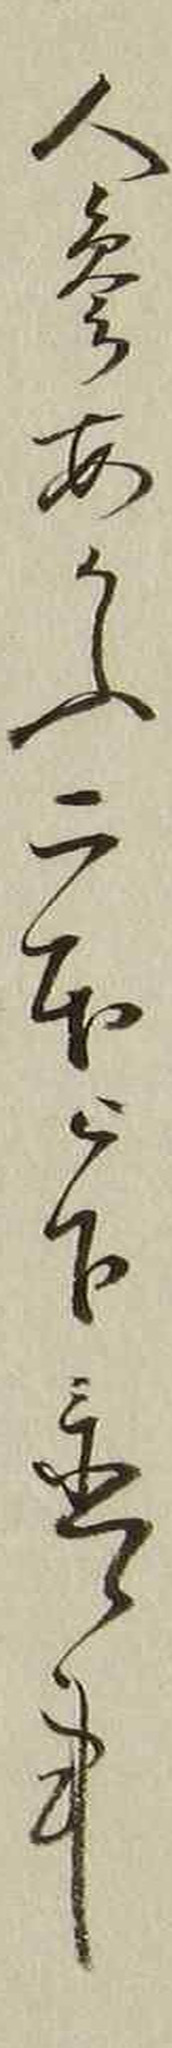人参あかふ二本被下置候事
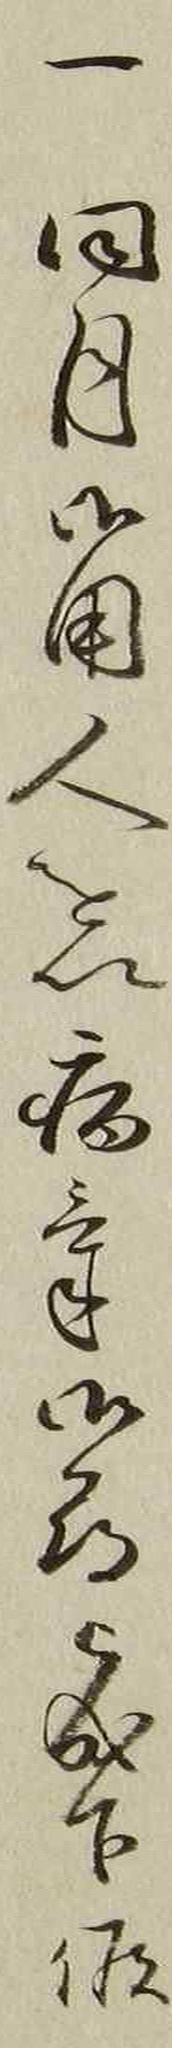一同月御用人を以病気御為被成下候
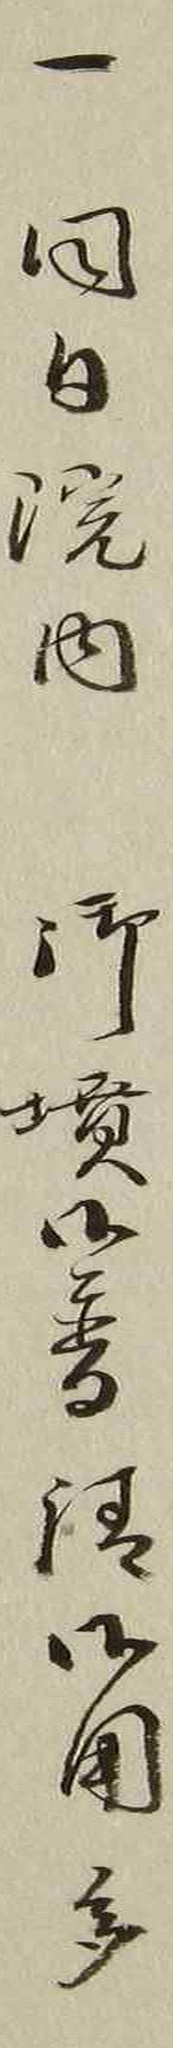一同日院内御墳御普請御用多
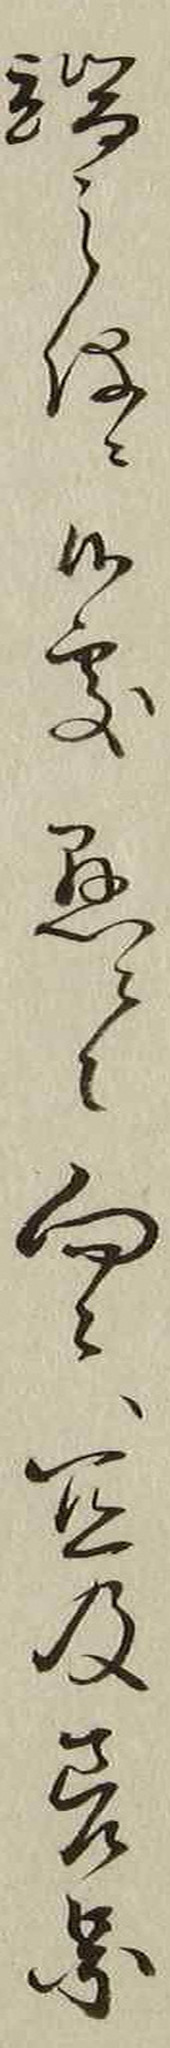端之儀に候処懸にて向々へ宜及差図
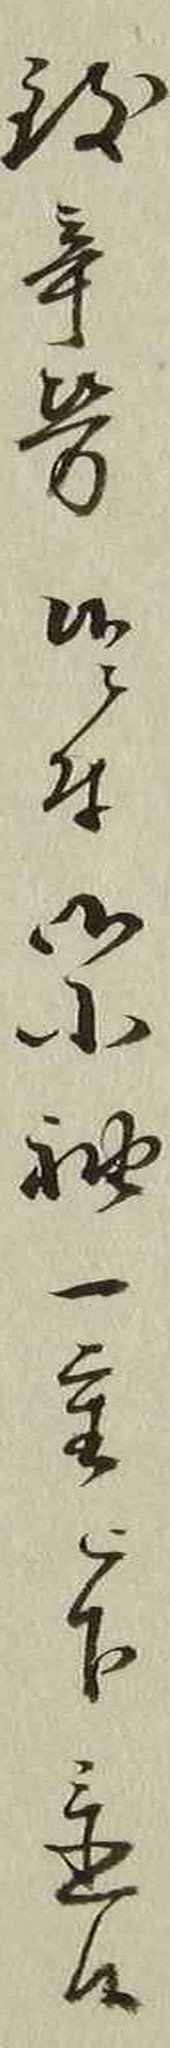致辛労候に付御小袖一重被下置候
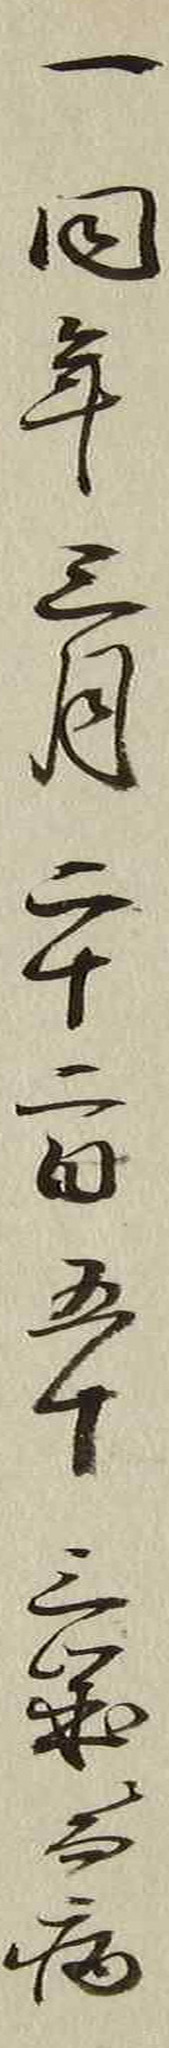一同年三月二十二日五十三歳に而病
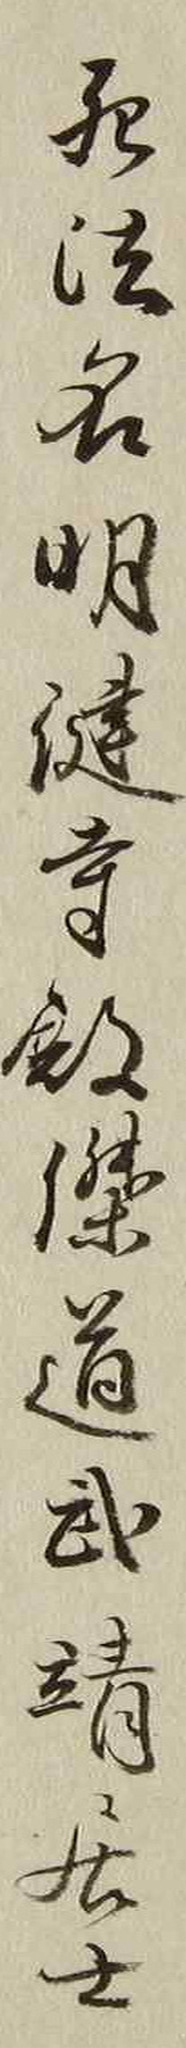死法名明健寺殿傑道武靖居士
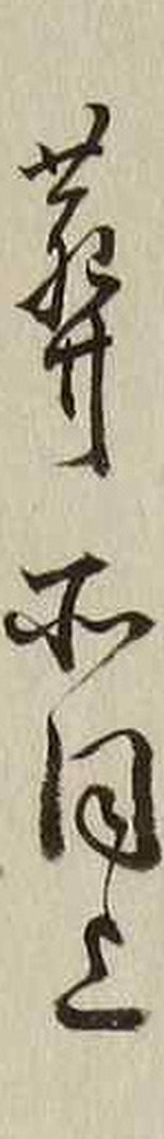葬所同上
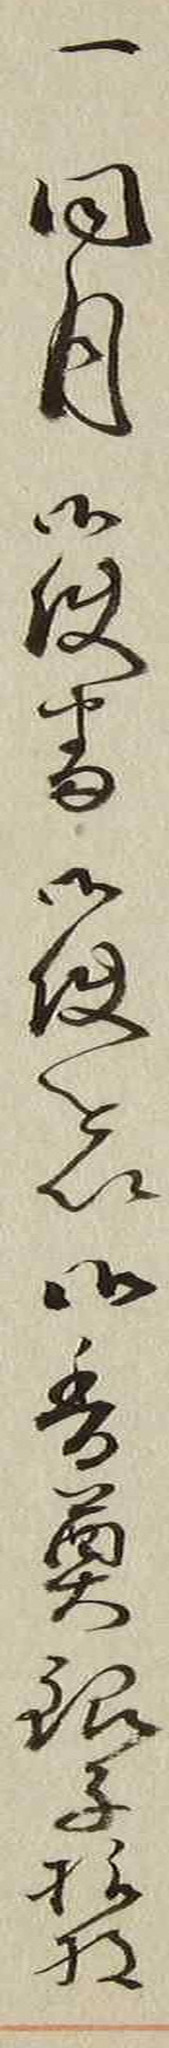一同月御使番御使を以御香典銀子拾枚
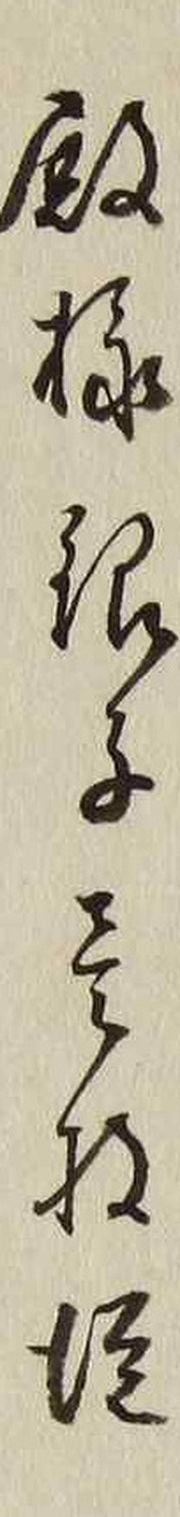殿様銀子壱枚従
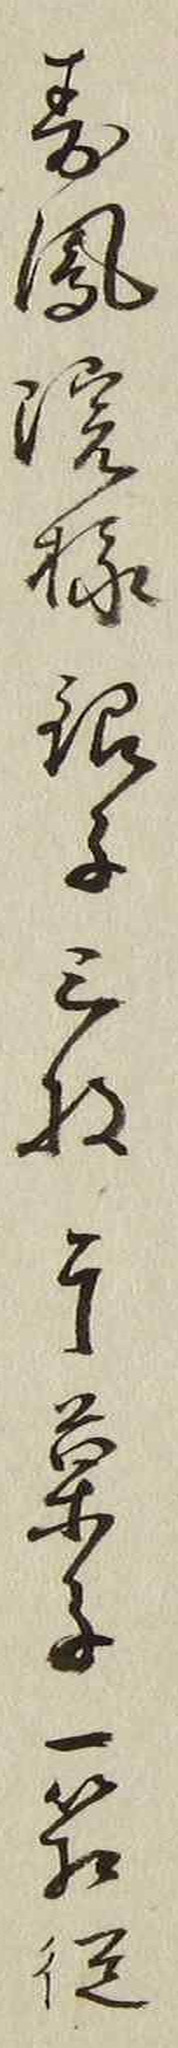寿鳳院様銀子三枚干菓子一箱従
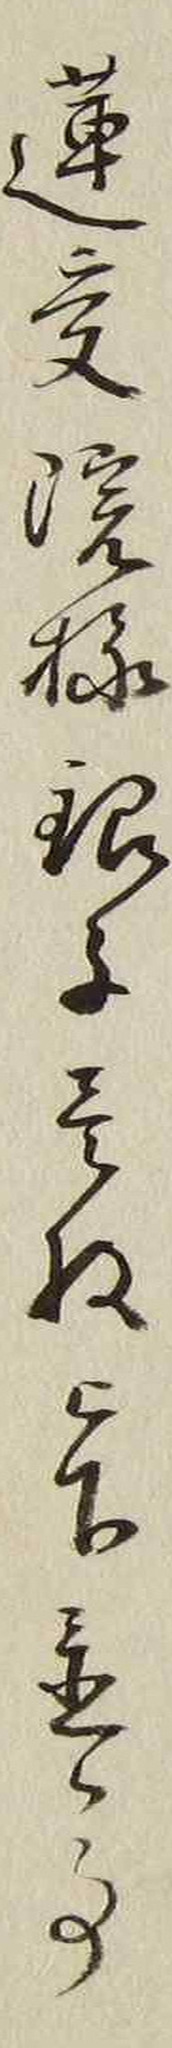蓮受院様銀子壱枚被下置候事
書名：諸士系譜　巻之159　な之部1
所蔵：会津若松市立会津図書館
